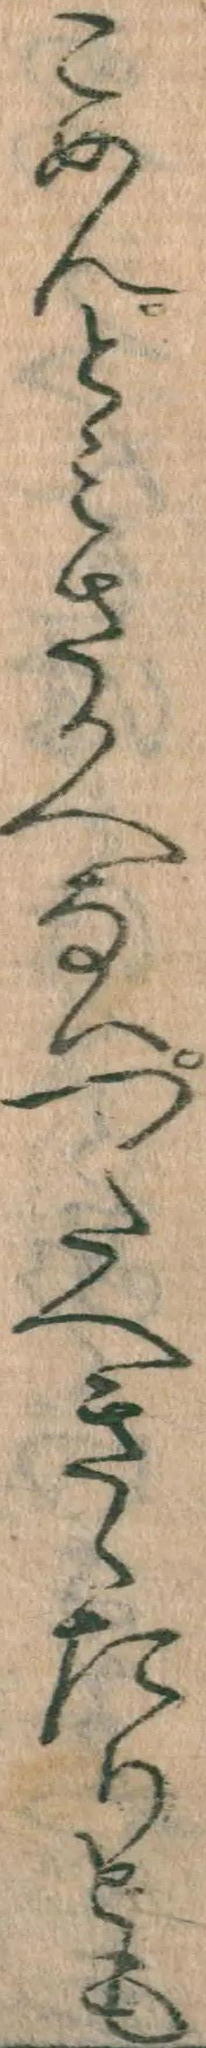こめん。とみさかへなは。つたへきゝたりとも
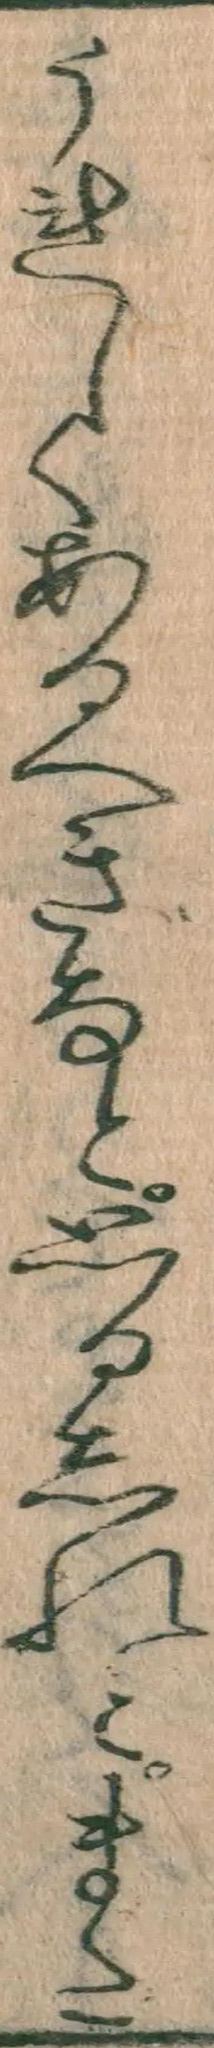うれしくあるへきなと。思ひしれと。また
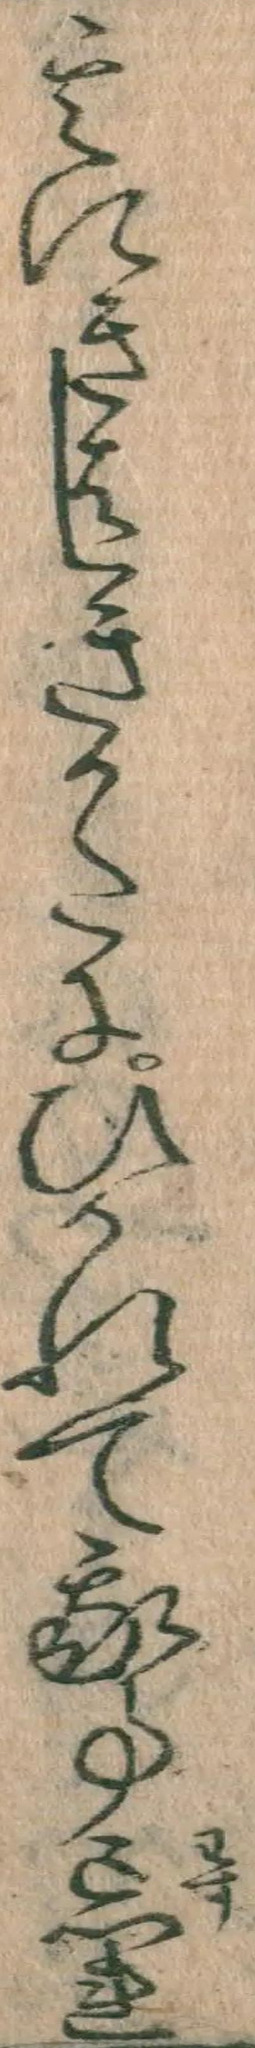其にきはしきかたに。ひかれて我事忘れ
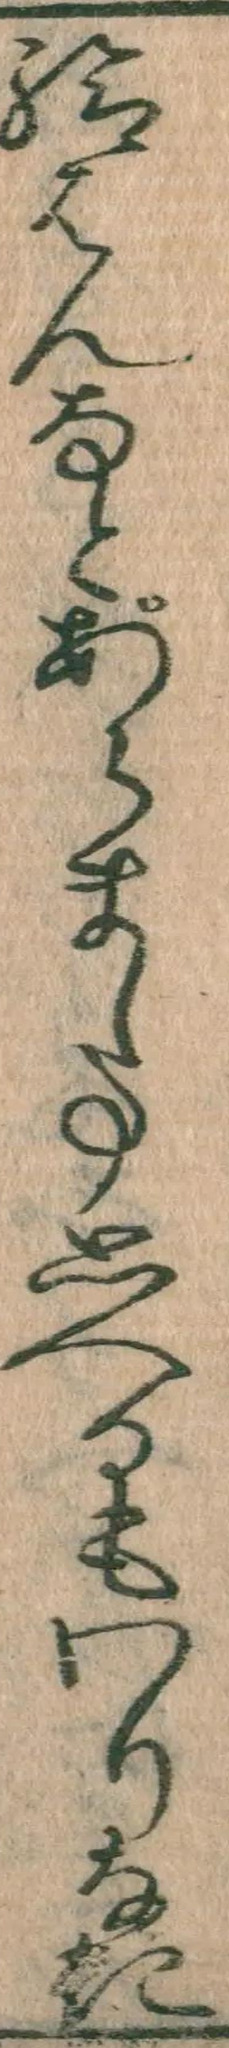給はんなと。あらまし事思へるもわりなき
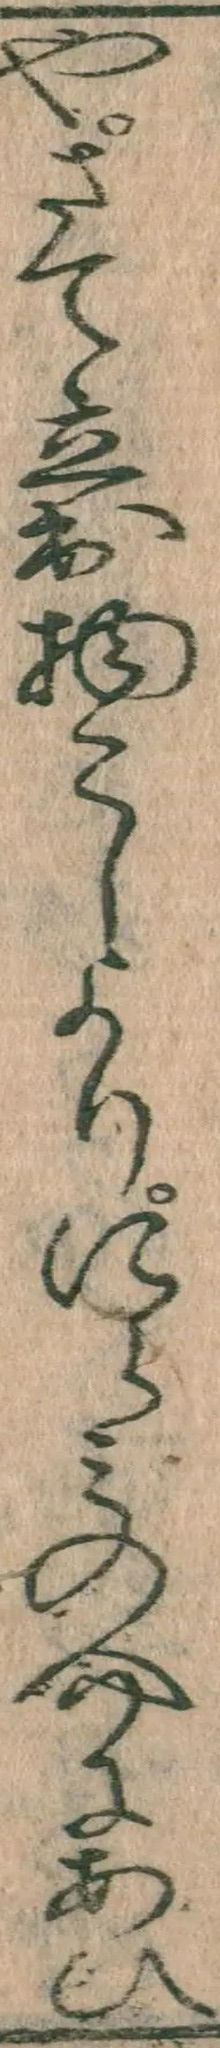や。さて立出物こしより。にらみの介にあひ
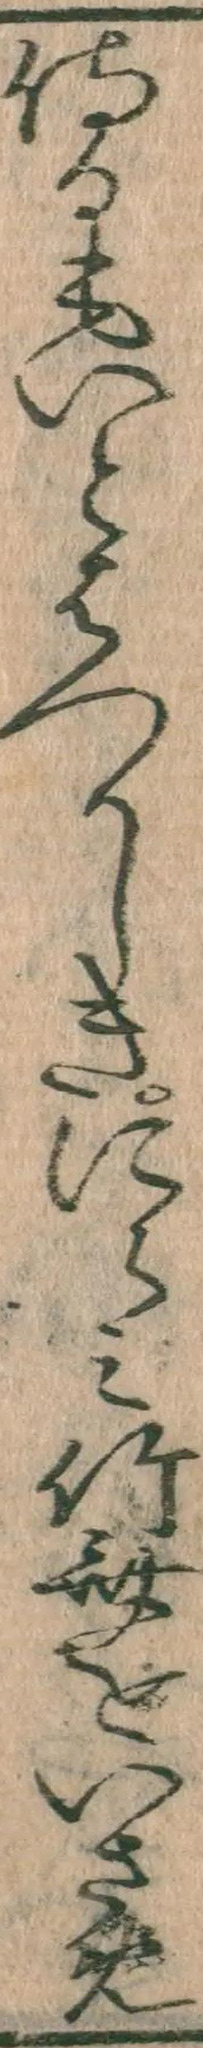侍るもいとはつかしき。にらみ竹斎をいさめ
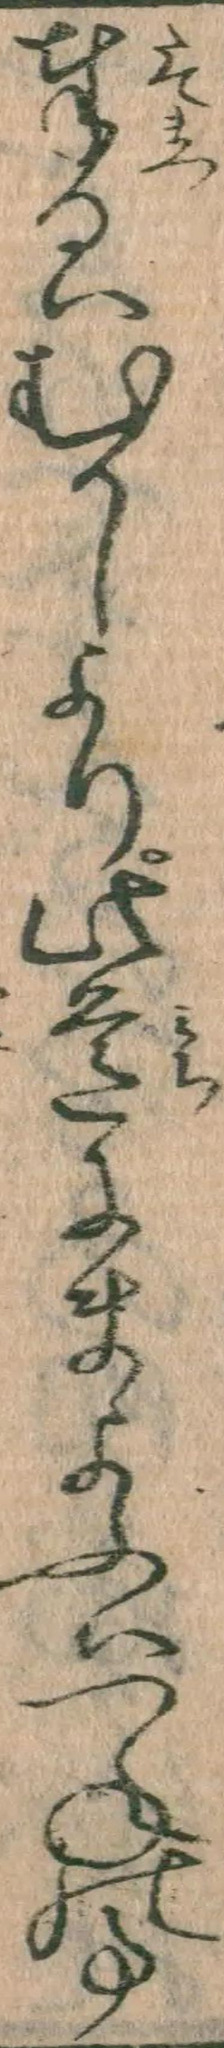奉るはむかしより。此道にまよふはつねの事
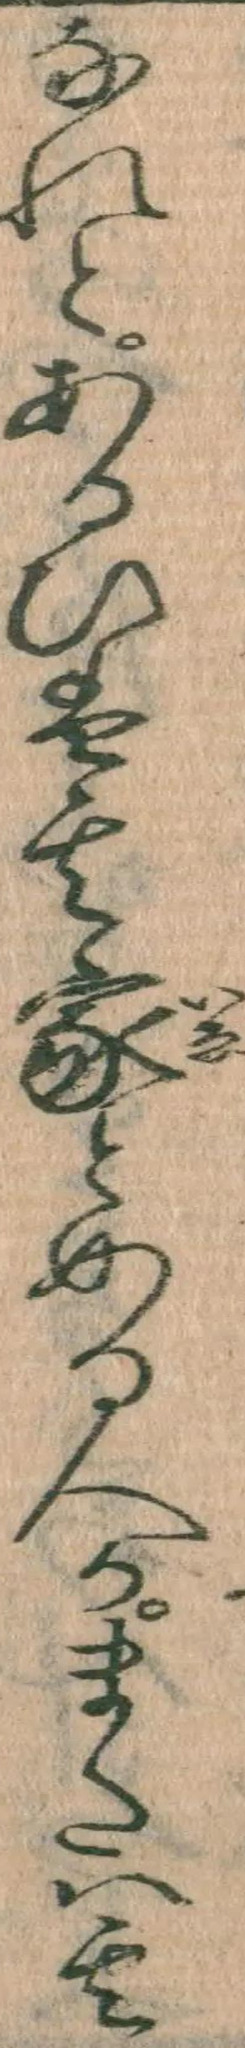なれと。あるひは其家とめる人か。または其
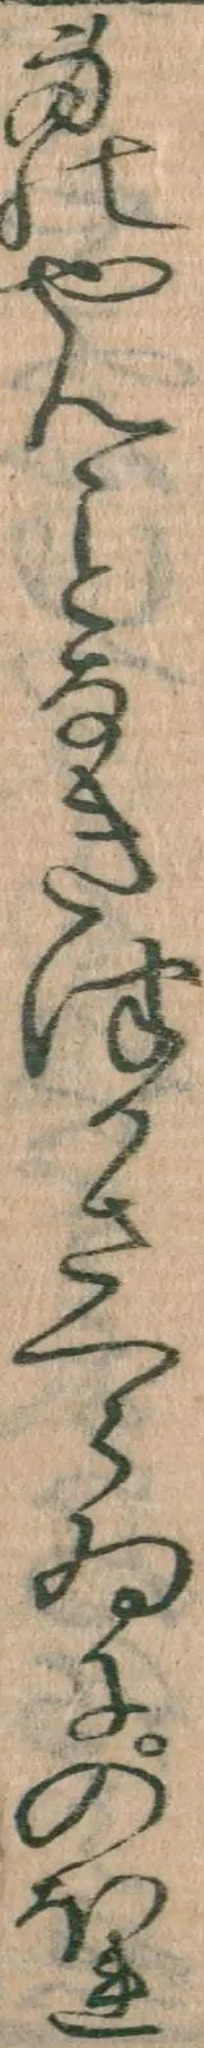身のやんことなきつかさくらゐに。のほれ
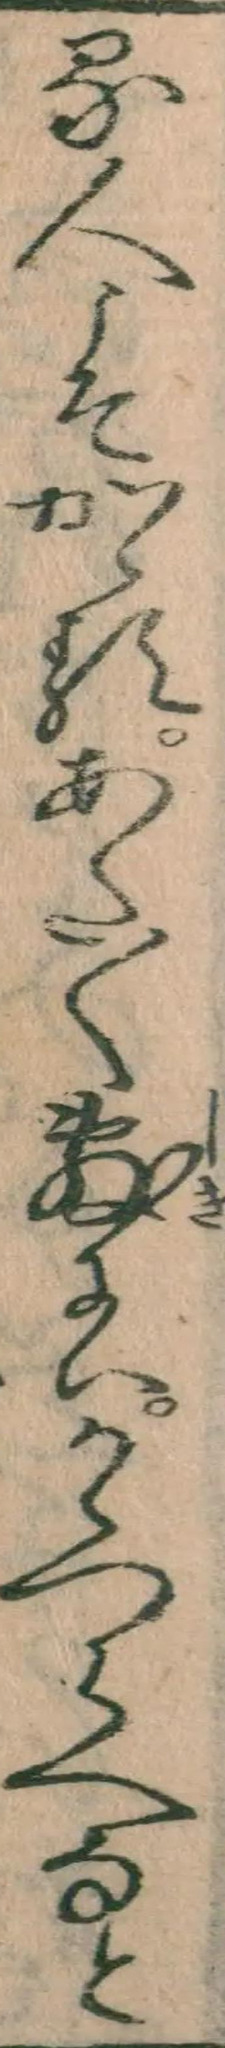る人こそかゝる。あた〳〵敷には。かゝつらへなと
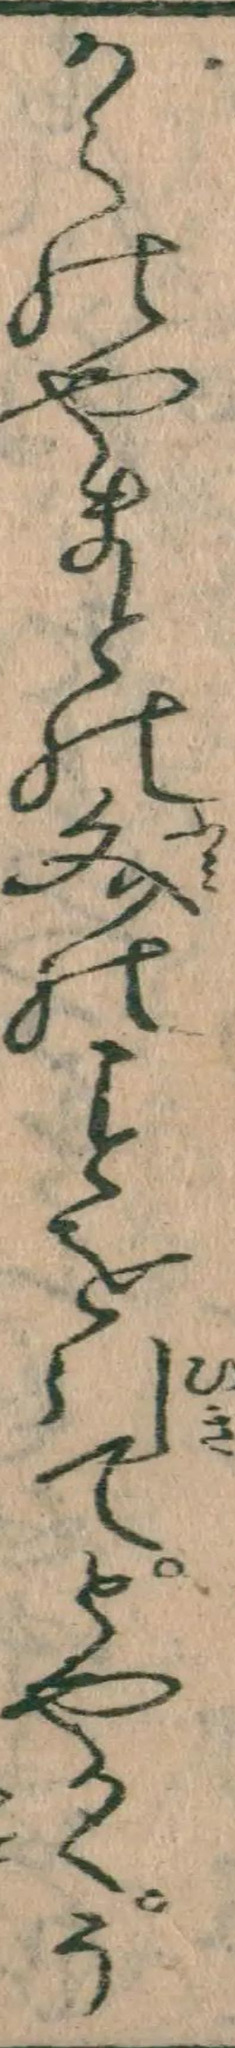からのやまとの文のことを引て。とやかく。う
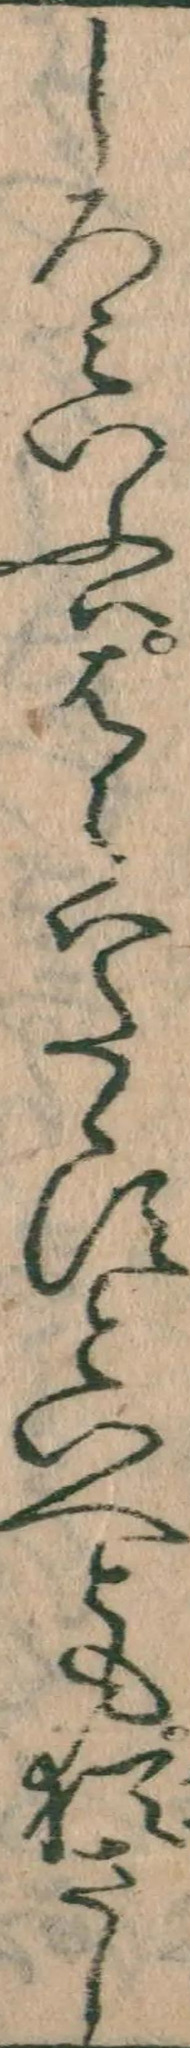しろみいふは。はしはたゝすといへとも。猶さし
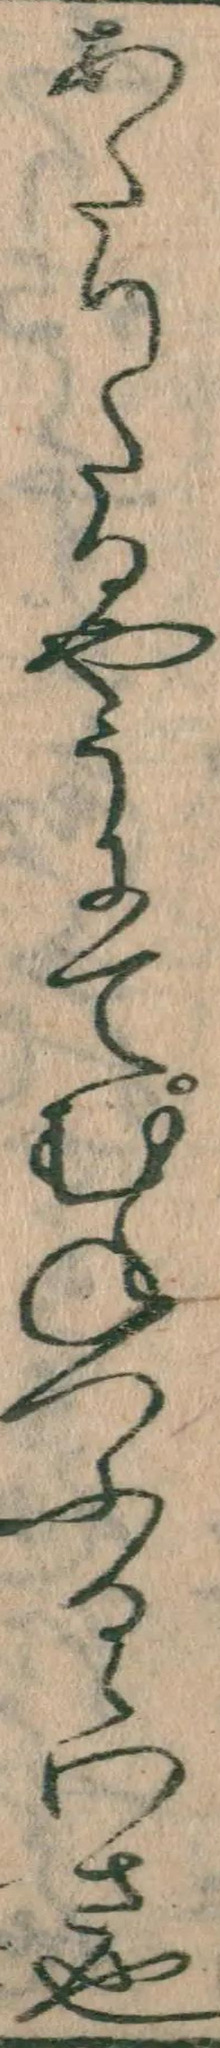あたりたるやうにて。むねつふるゝわさ也
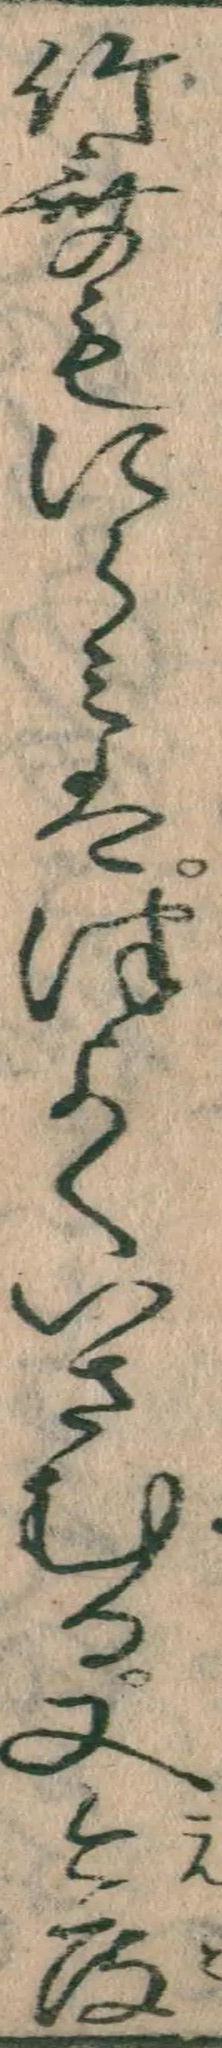竹斎もにらみは。つよくいさむる。又今度
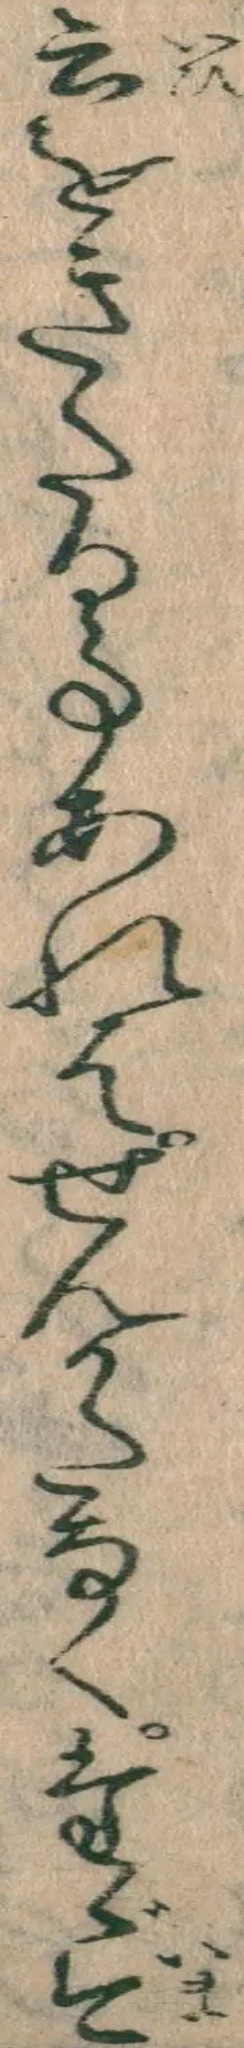云をきたる事あれは。せんかたなく。たゞ今
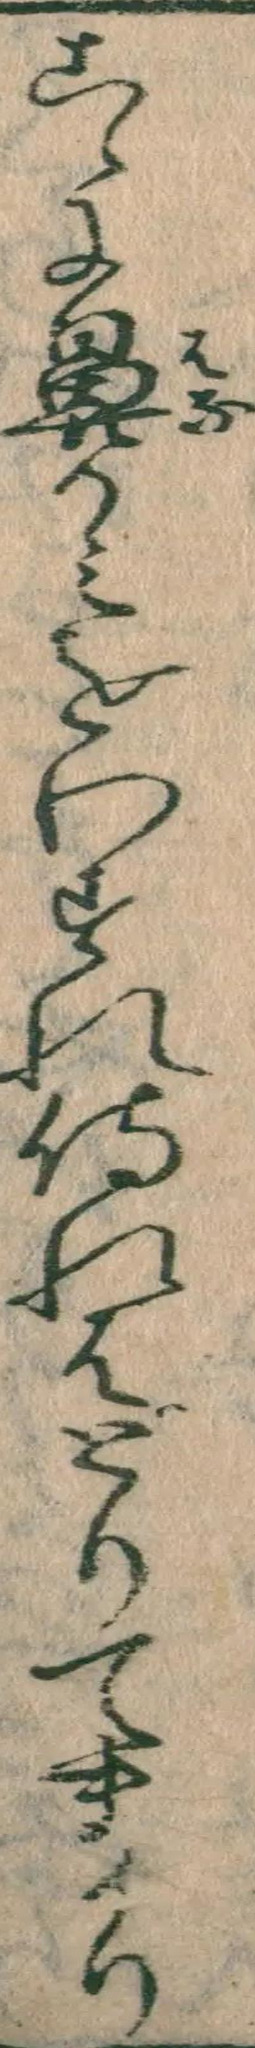こゝに鼻かみをわすれ侍れは。とりてまかり
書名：竹斎狂歌物語 3巻
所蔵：国立国会図書館 National Diet Library, JAPAN
